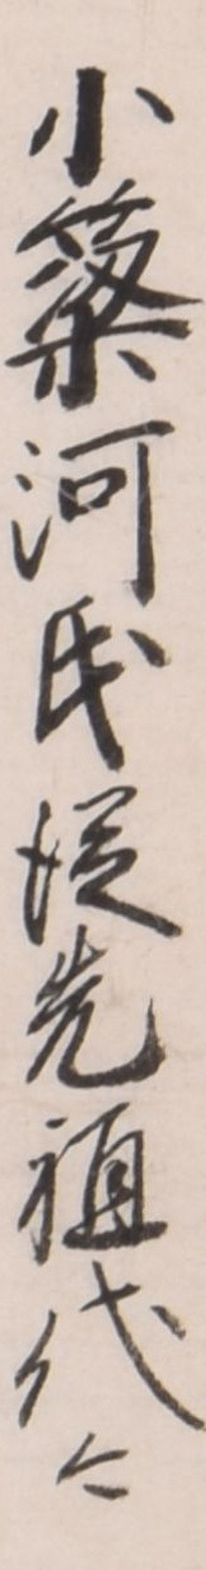小簗河氏従先祖代々
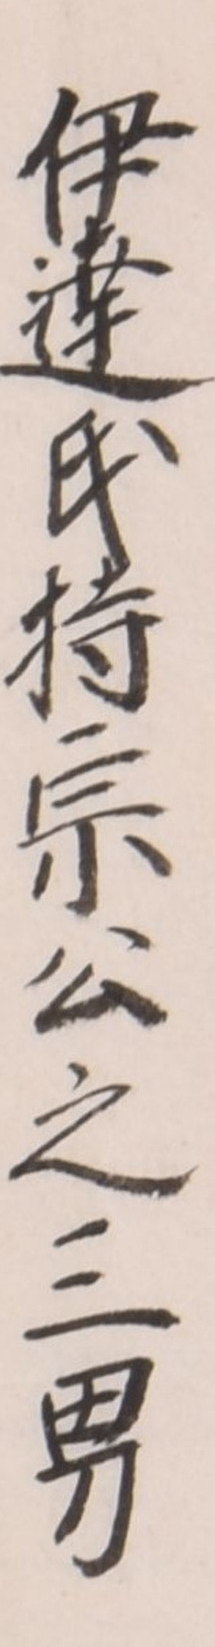伊達氏持宗之三男
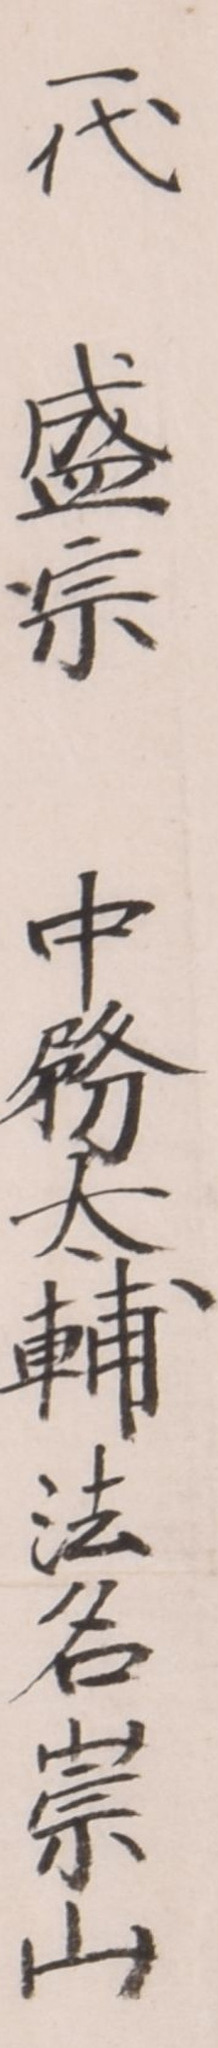一代盛宗中務太輔法名崇山
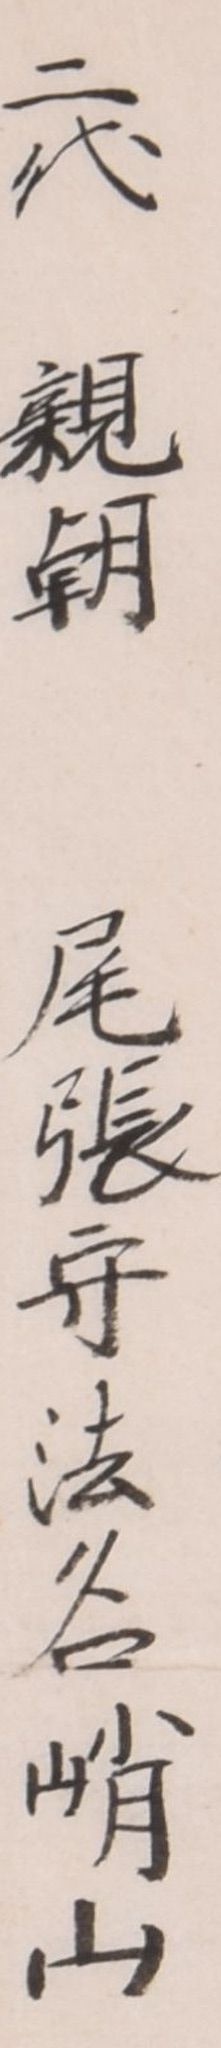二代親朝尾張守法名峭山
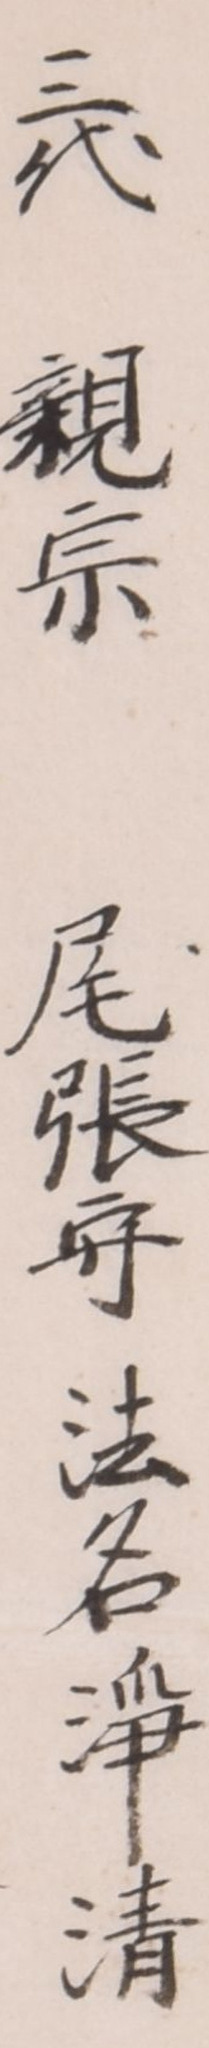三代親宗尾張守法名浄清
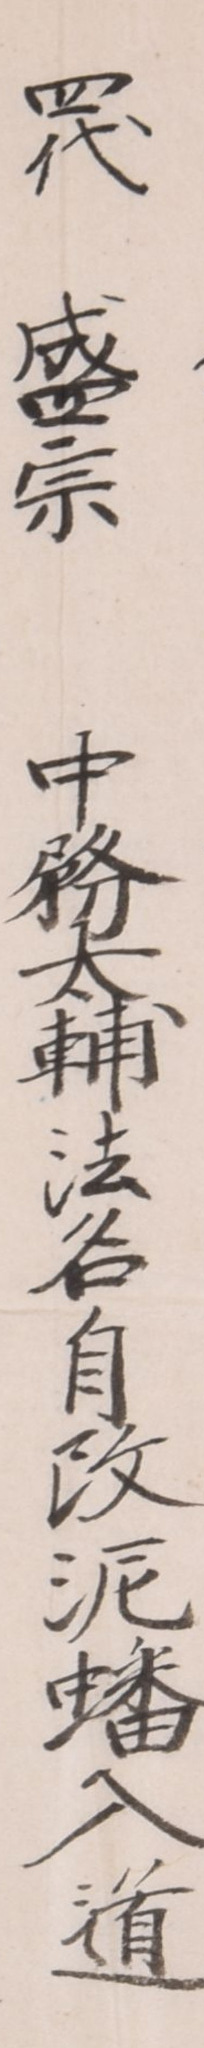四代盛宗中務太輔法名自改泥蟠入道
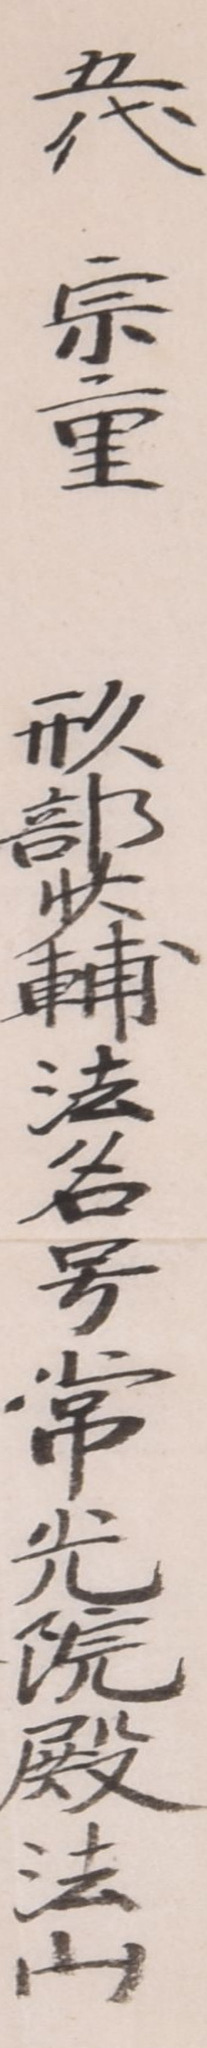五代宗重形部少輔法名号常光院殿法山
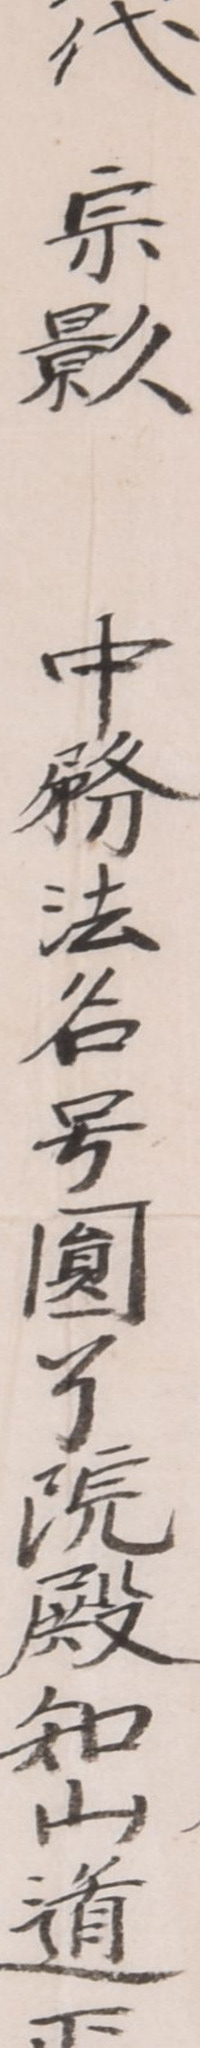六代宗影中務法名号円了院殿知山道正
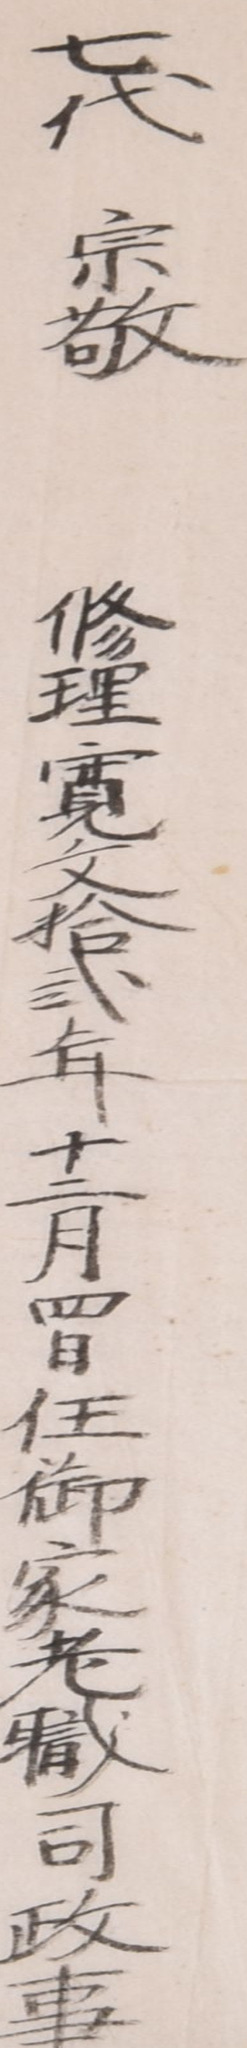七代宗敬修理寛文拾弐年十二月四日任御家老職司政事
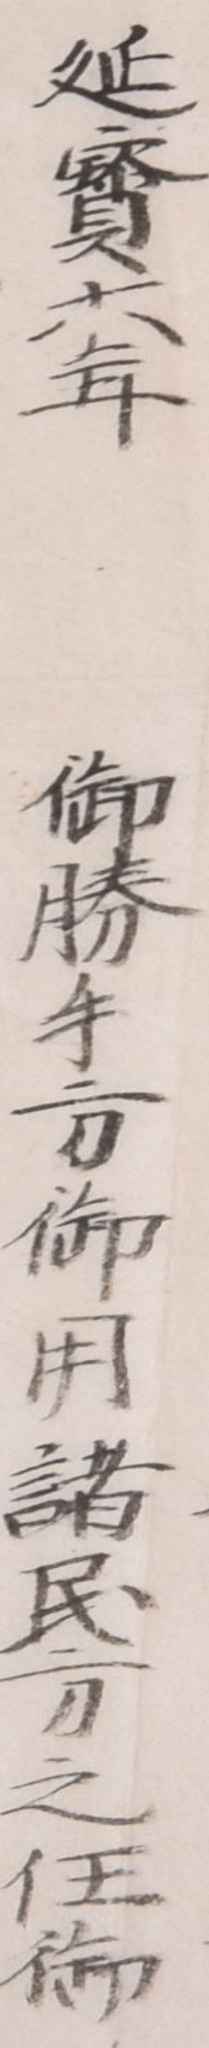延宝六年御勝手方御用諸民方之任御
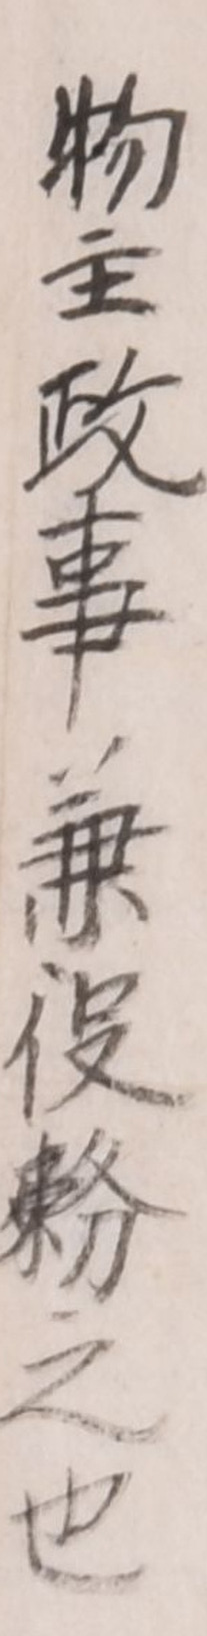物主政事兼役務之也
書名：小梁河氏従先祖代々
